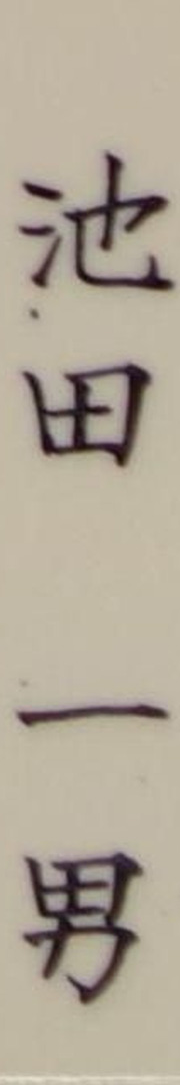池田一男
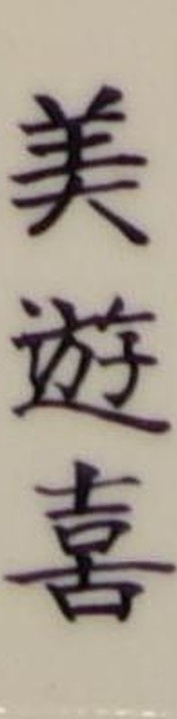美遊喜
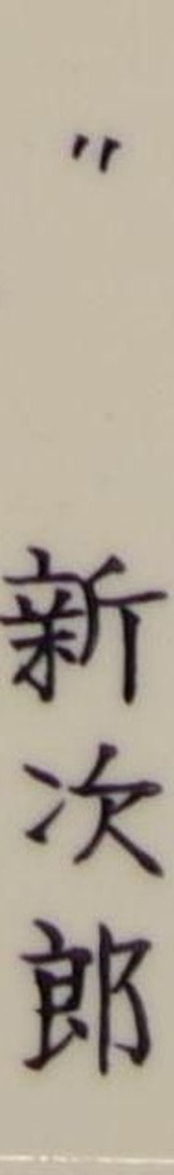新次郎
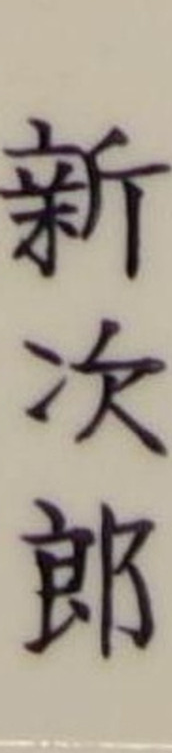新次郎
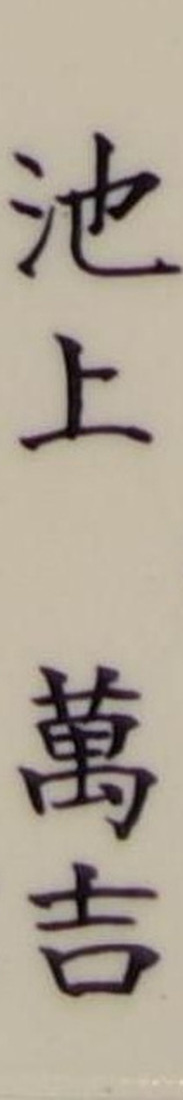池上萬吉
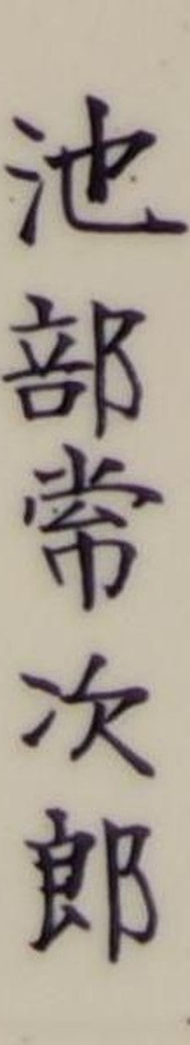池部常次郎
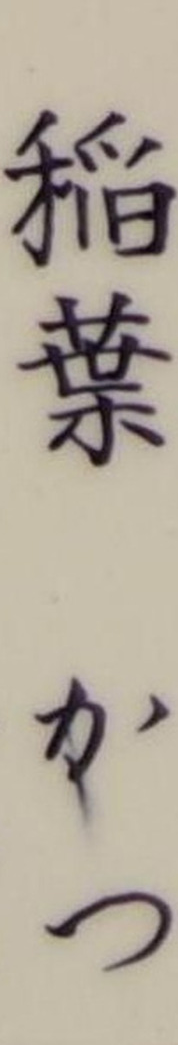稲葉かつ
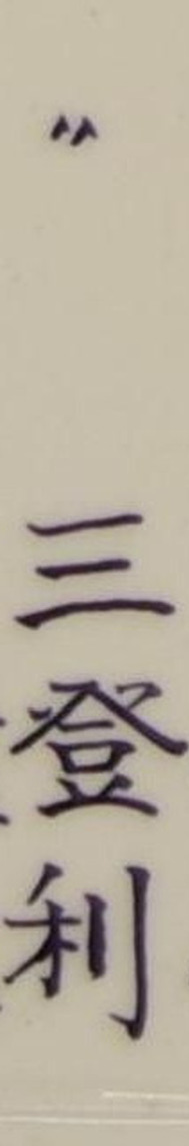三登利
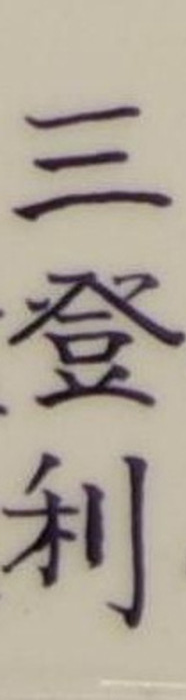三登利

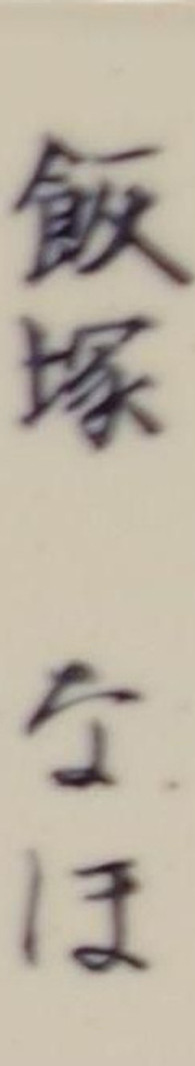飯塚なほ
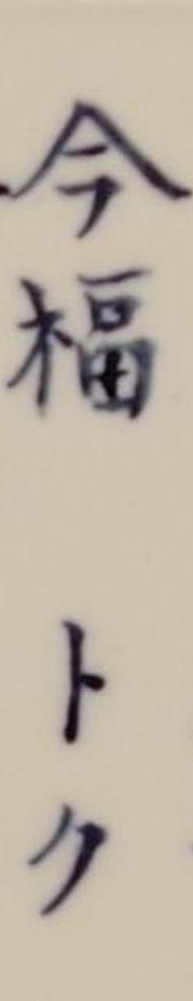今福トク
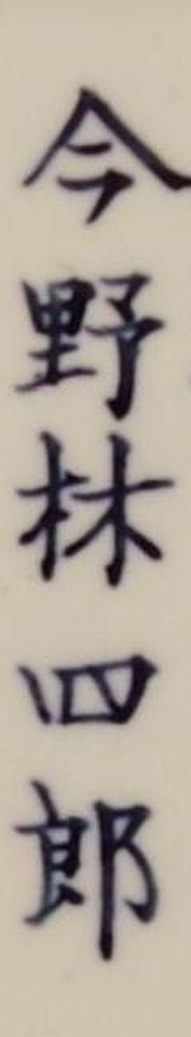今野林四郎
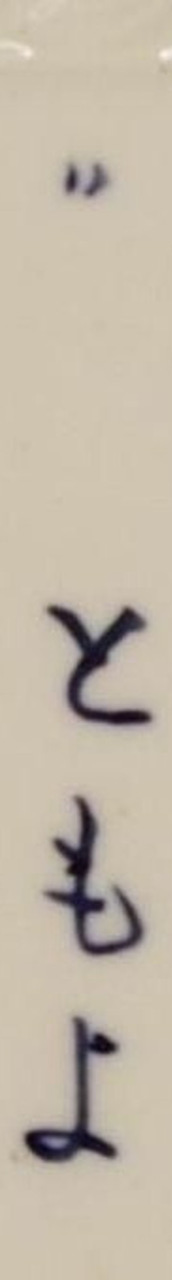ともよ
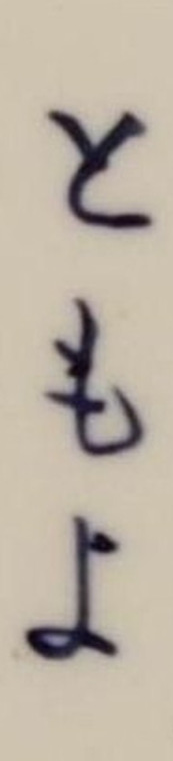ともよ
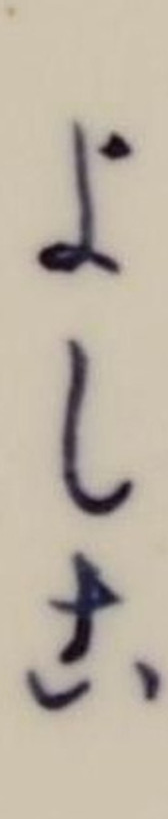よしこ
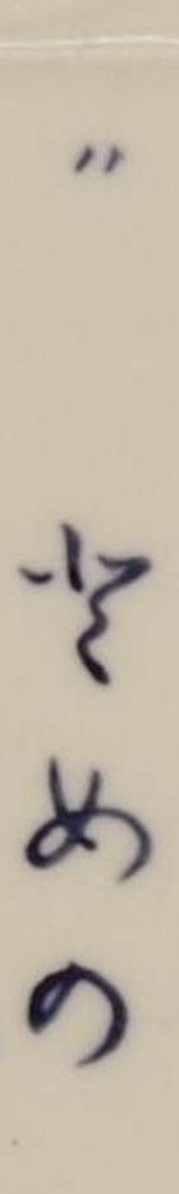とめの
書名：M~S
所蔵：高野山金剛峯寺
